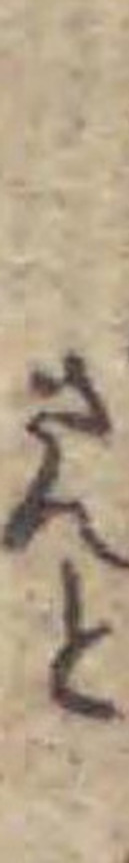さんと
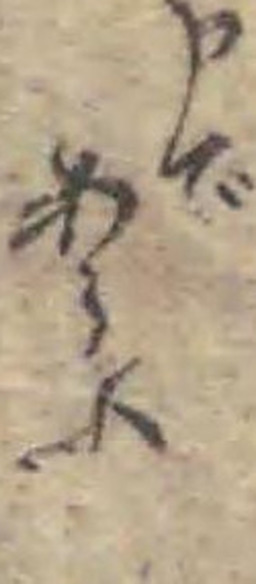あらふ
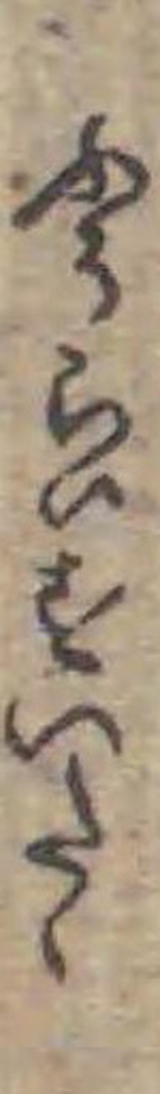ふうらいすいたく
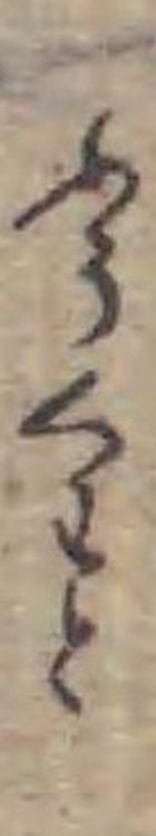ふうくわと
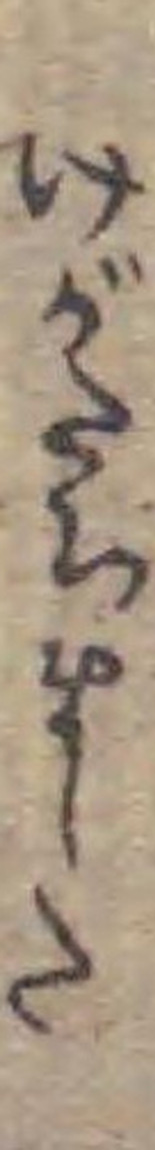けがたちました
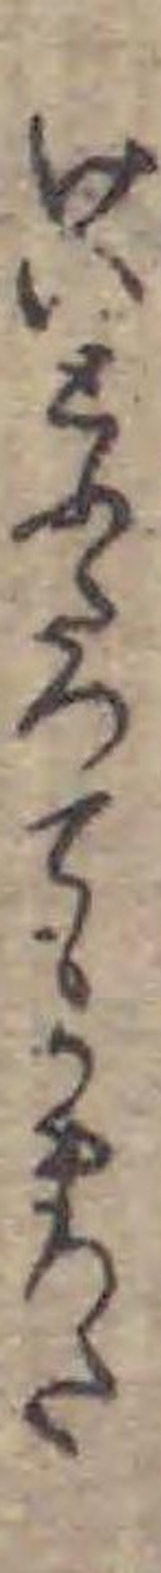けいとふたつてもかまつた
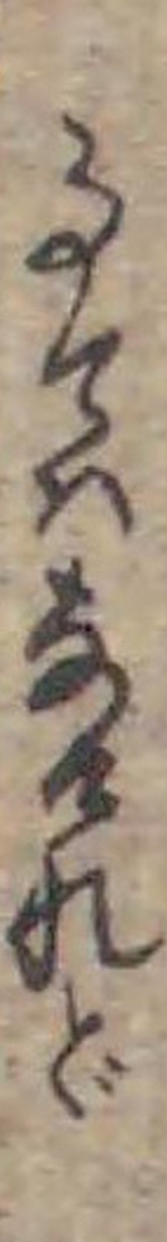事てはなけれど
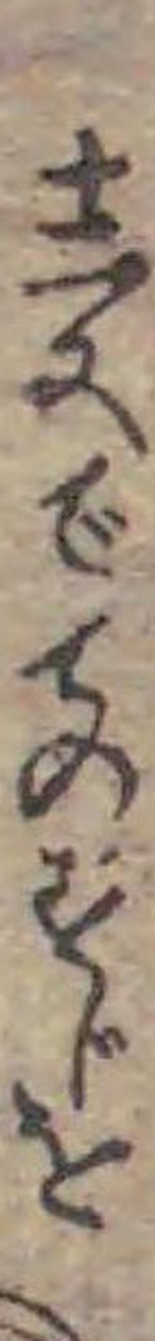十二文でてのすじを
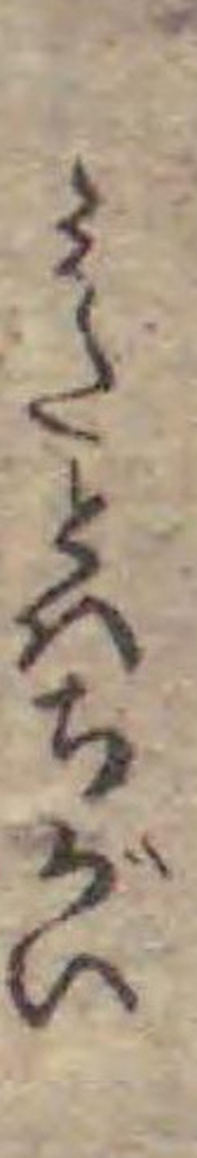みたとはちがい
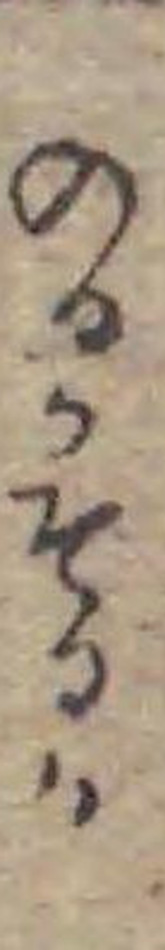のるかそるか
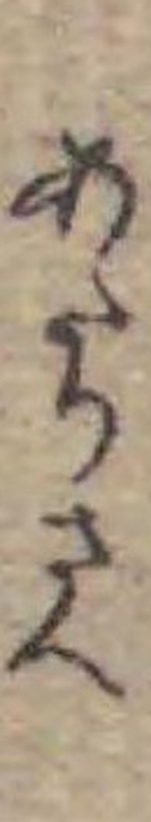あたりさへ
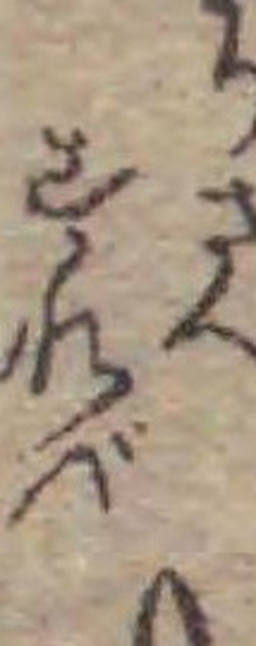すれば
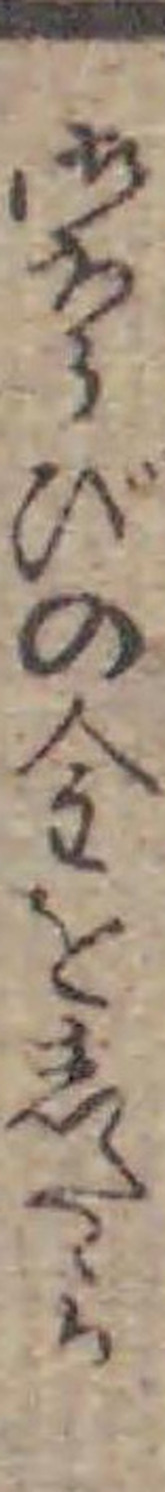御ほうびの金をしたゝか
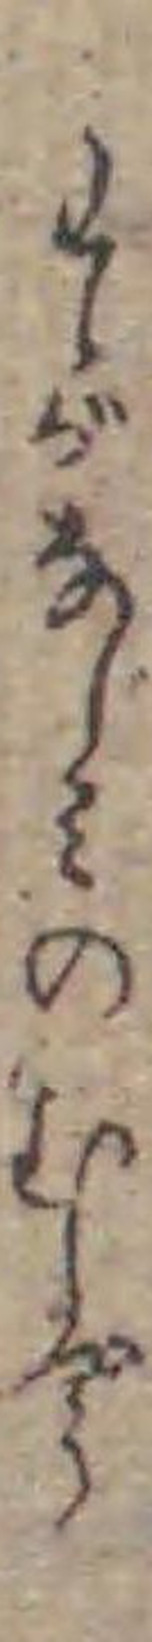わしがなじみのむしやう
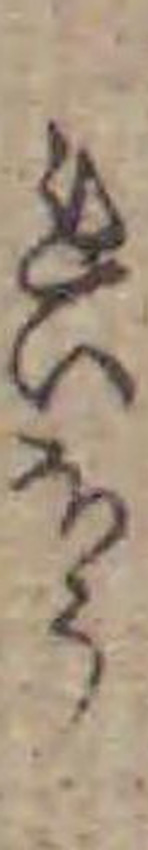れいほう
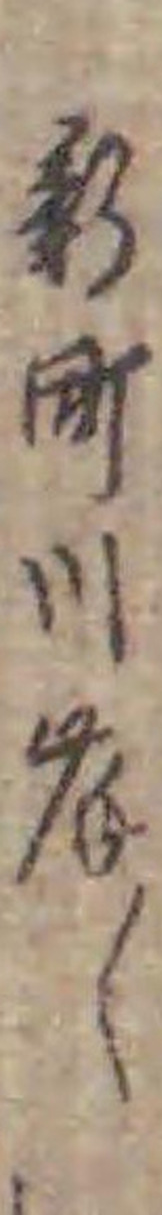新町川岸〳〵
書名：威気千代牟物語 : 2巻
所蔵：国立国会図書館 National Diet Library, JAPAN
